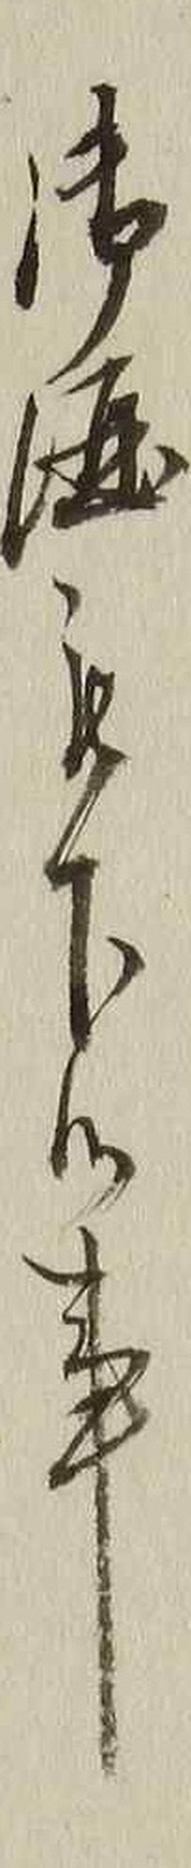御酒被下候事
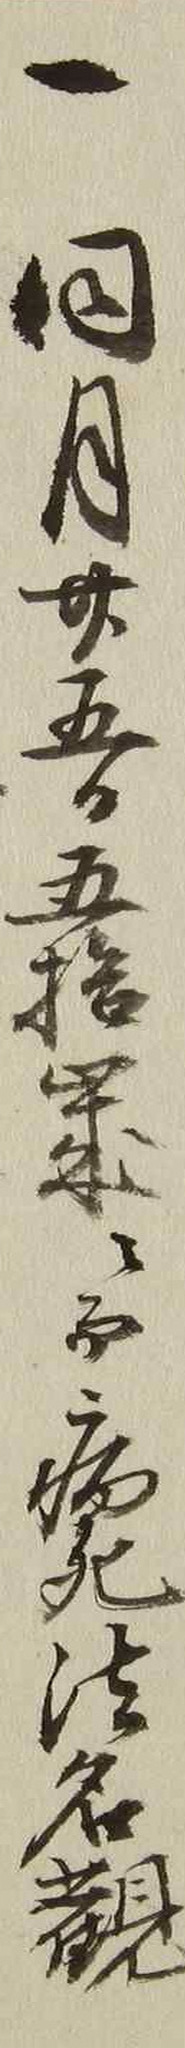一同月廿五日五拾歳ニ而病死法名観
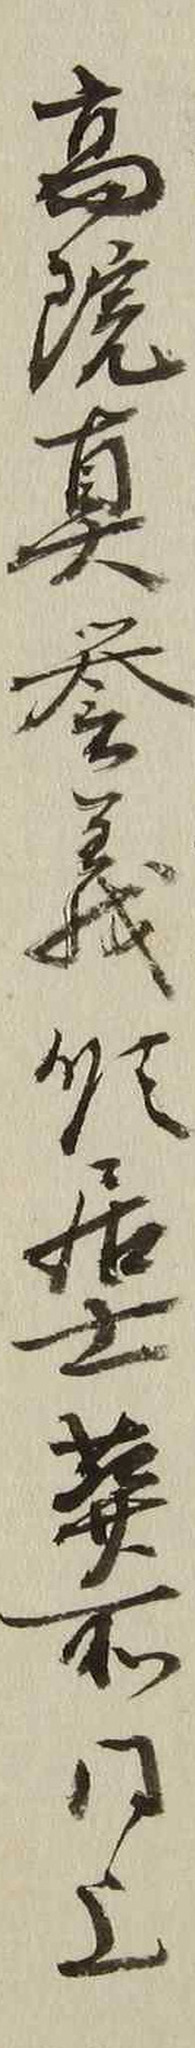高院真誉義順居士葬所同上
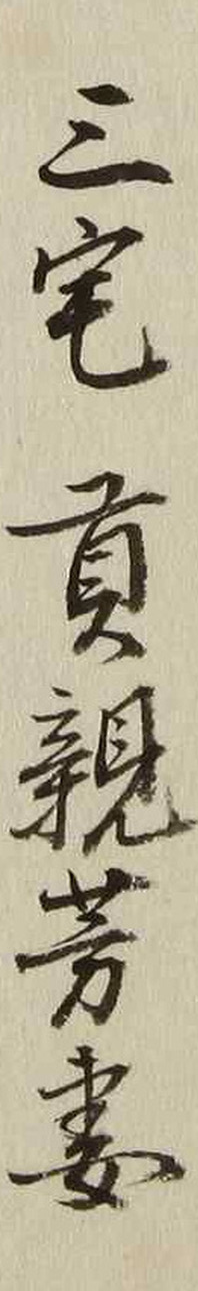女三宅貢親芳妻
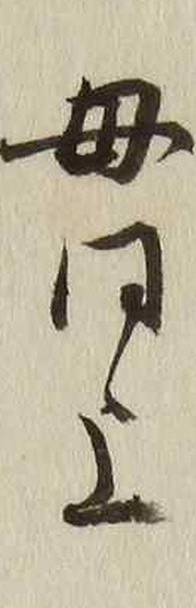母同上
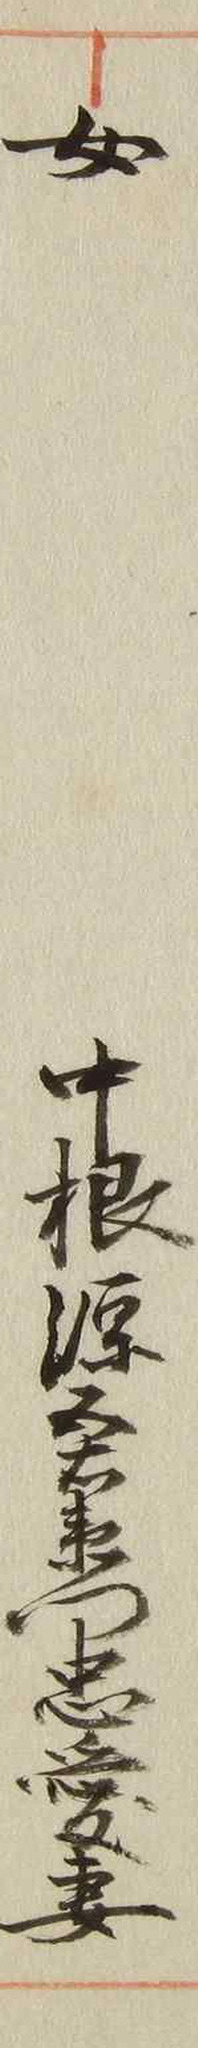女中根源五右衛門忠愛妻
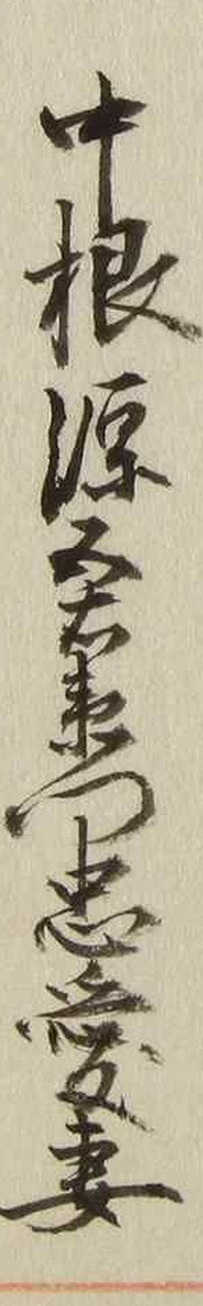女中根源五右衛門忠愛妻
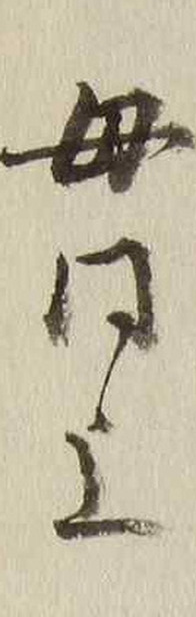母同上
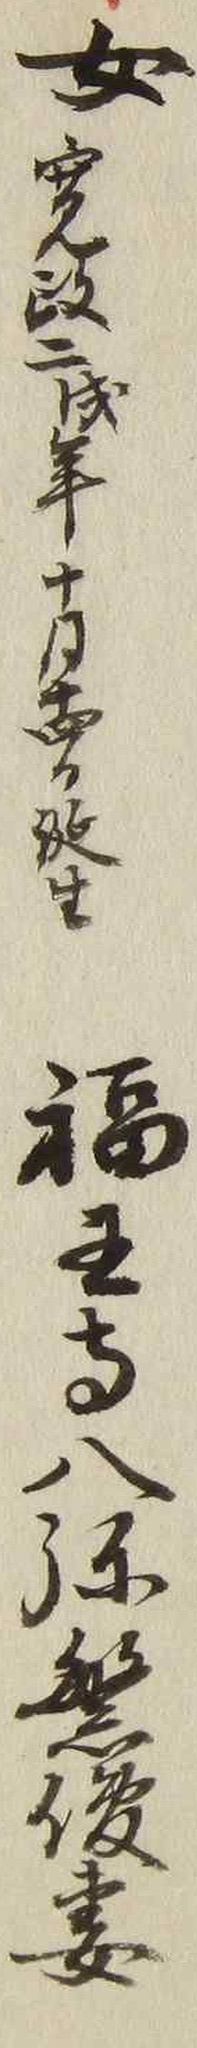寛政二戌年十月十四日誕生福王寺八弥繁俊妻
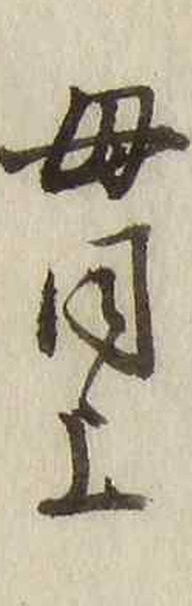母同上

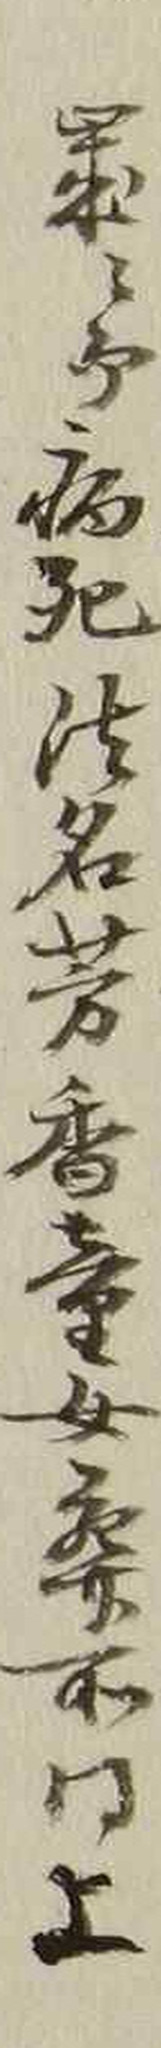歳ニ而病死法名芳香童女葬所同上
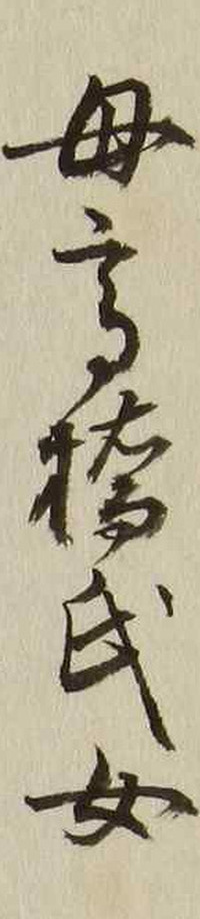母高橋氏女
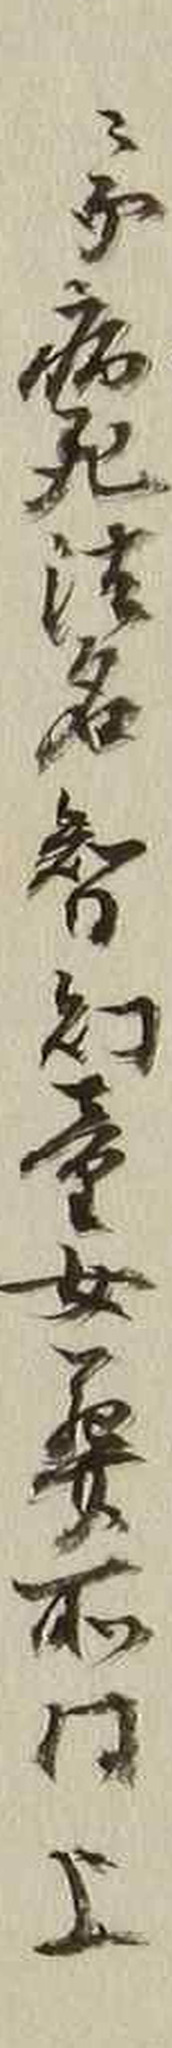ニ而病死法名智幻童女葬所同上
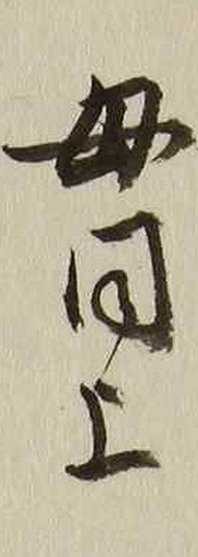母同上
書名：諸士系譜　巻之23　い之部23
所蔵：会津若松市立会津図書館
